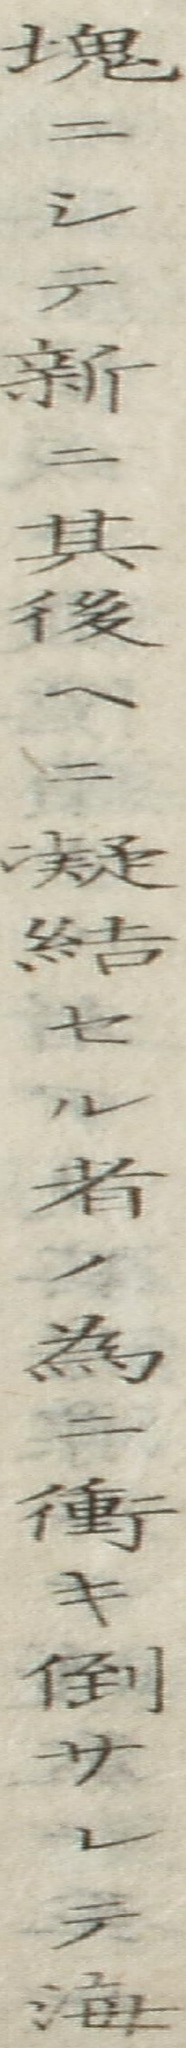塊ニシテ新ニ其後ヘニ凝結セル者ノ為ニ衝キ倒サレテ海
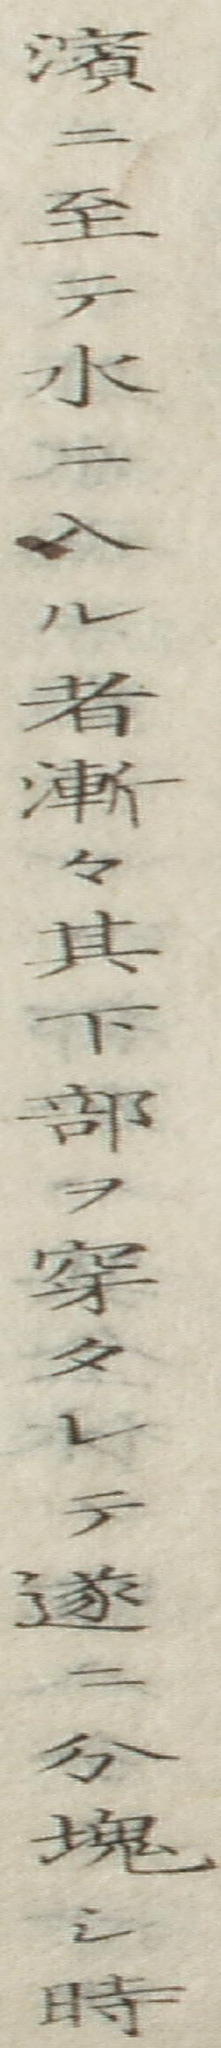浜ニ至テ水ニ入ル者漸々其下部ヲ穿タレテ遂ニ分塊シ時
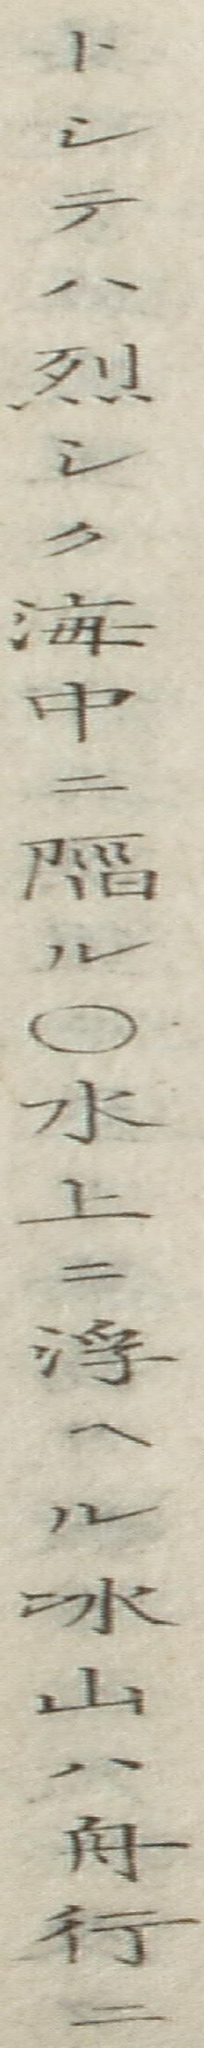トシテハ烈しく海中ニ陥ル○水上ニ浮ヘル氷山ハ舟行ニ
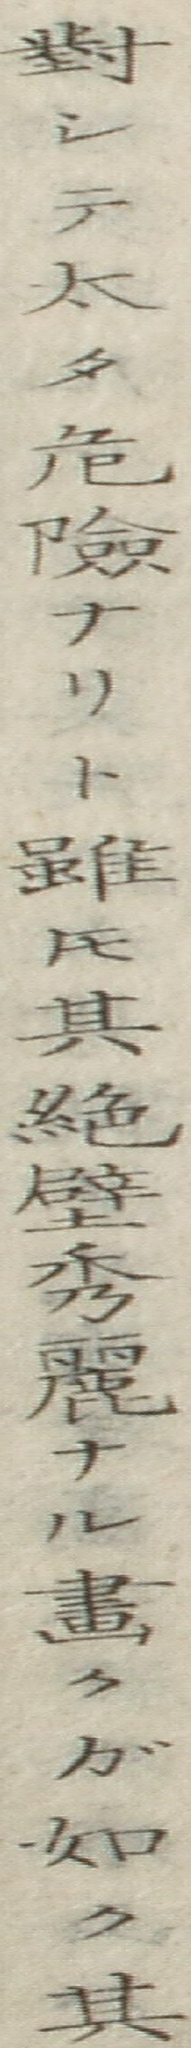対シテ太タ危険ナリト雖トモ其絶壁秀麗ナル画クガ如ク其

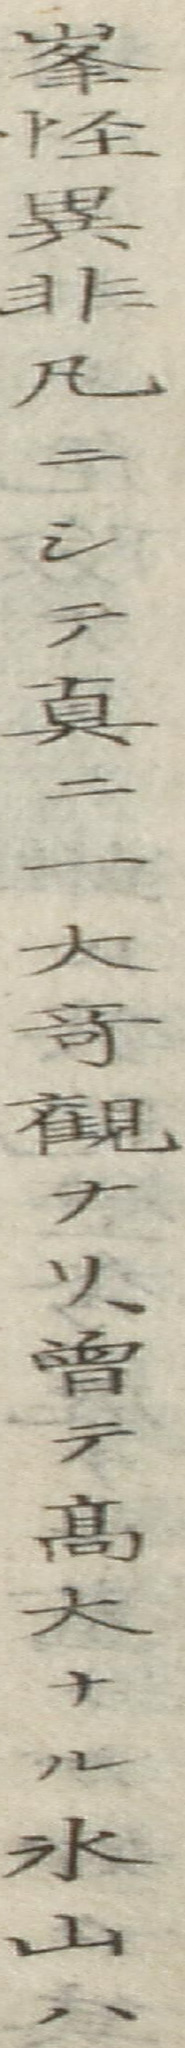峰怪異非凡ニシテ真ニ一大奇観ナリ、曾テ高大ナル氷山ハ
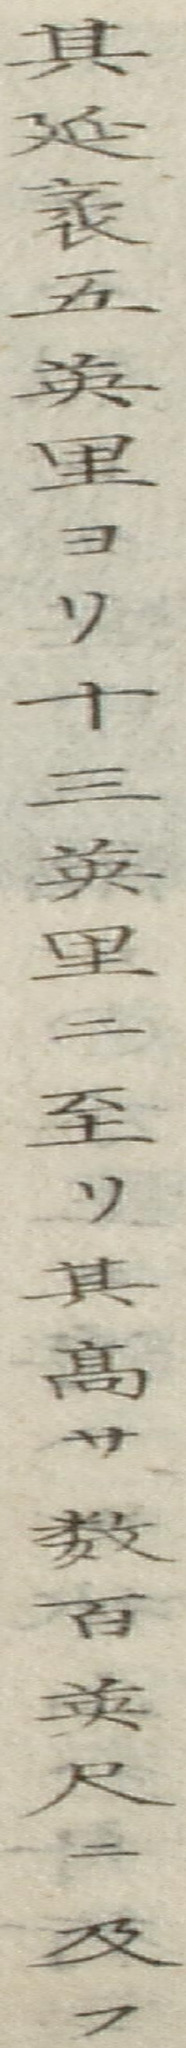其延袤五英里ヨリ十三英里ニ至リ其高サ数百英尺ニ及フ
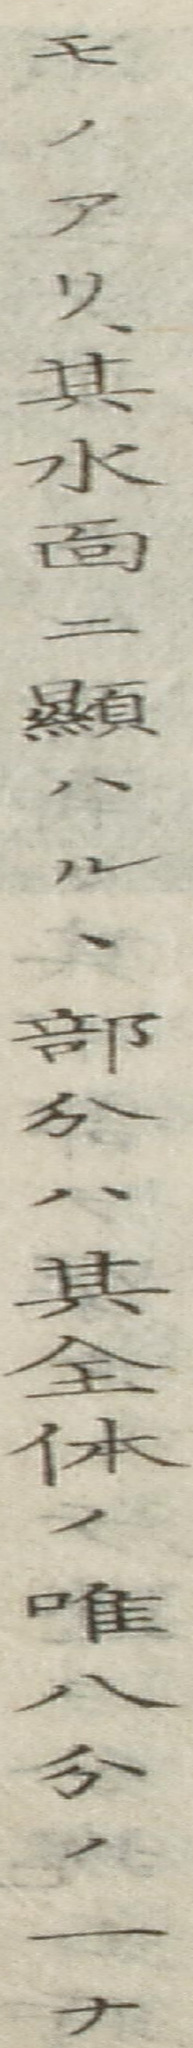モノアリ、其水面ニ顕ハルヽ部分ハ其全体ノ唯八分ノ一ナ
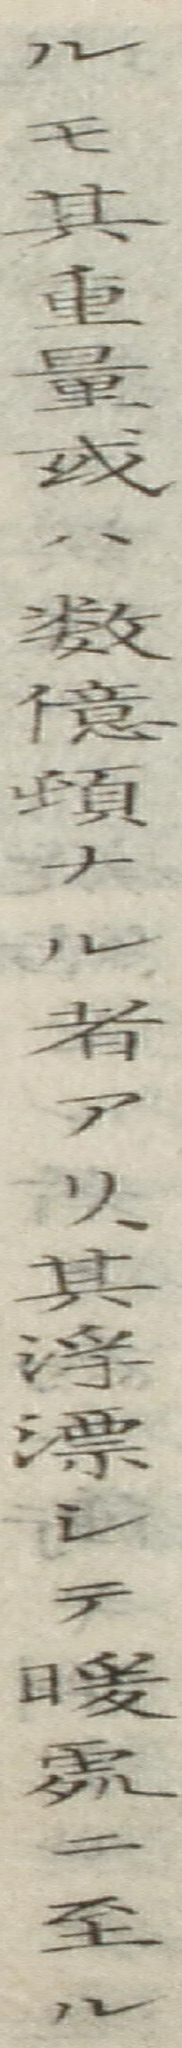ルモ其重量或ハ数億頓ナル者アリ、其浮漂シテ暖處ニ至ル
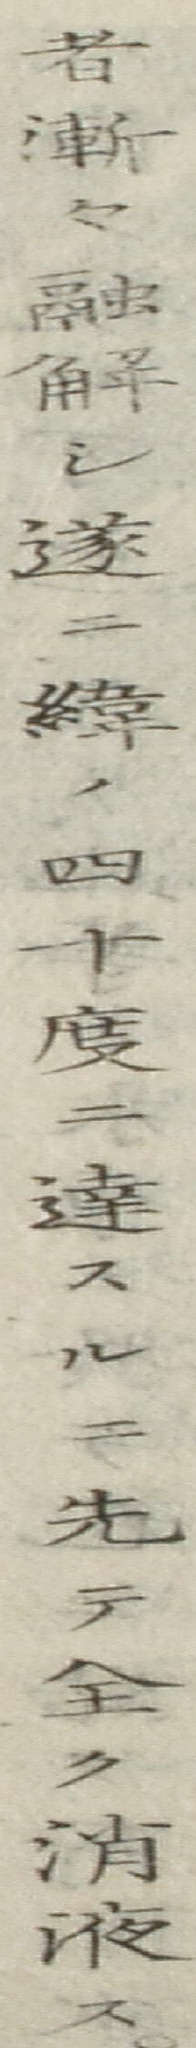者漸々融解シ遂ニ緯ノ四十度ニ達スルニ先テ全ク消液ス。
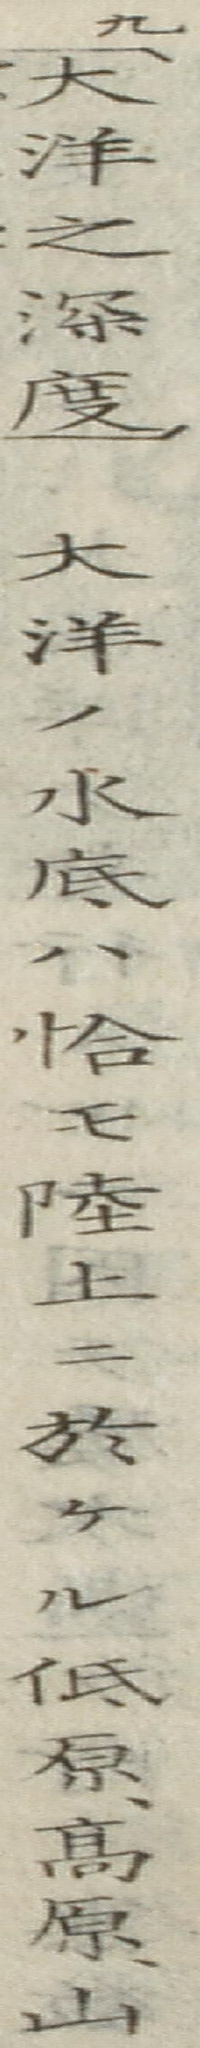九〔大洋之深度〕大洋ノ水底ハ恰モ陸上ニ於ケル低原、高原、山
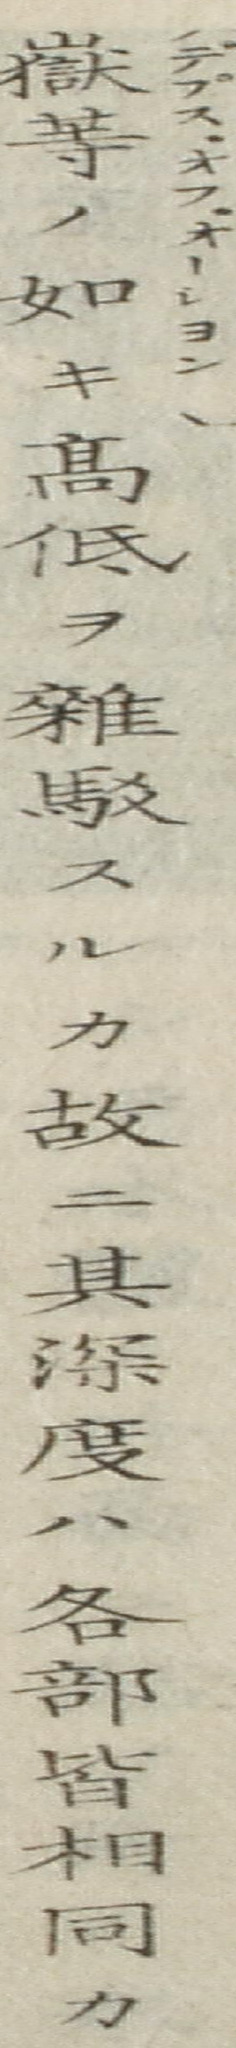嶽等ノ如キ高低ヲ雑駁スルカ故ニ其深度ハ各部皆相同カ
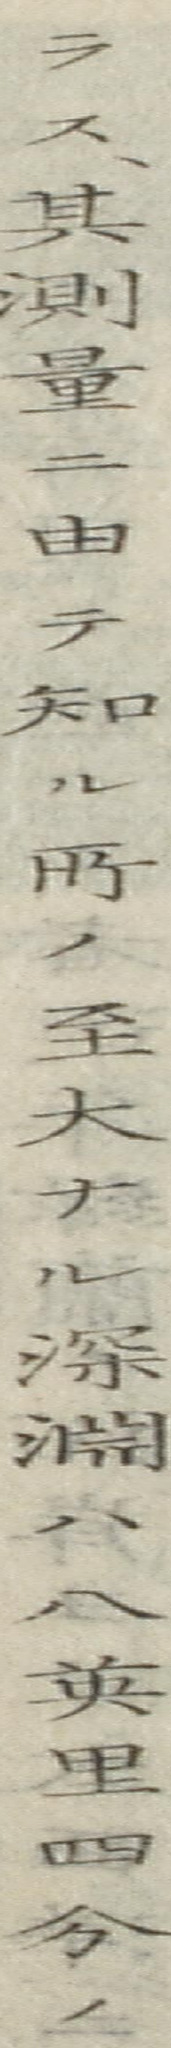ラス、其測量ニ由テ知ル所ノ至大ナル深淵ハ八英里四分ノ
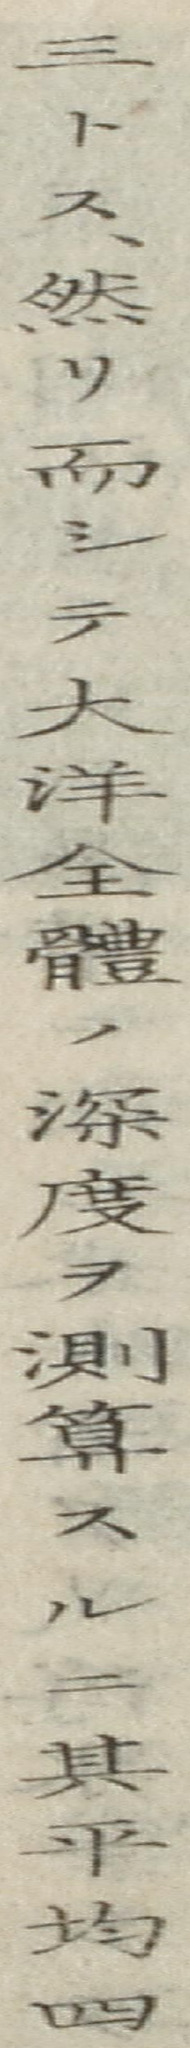三トス、然リ而シテ大洋全体ノ深度ヲ測算スルニ其平均四
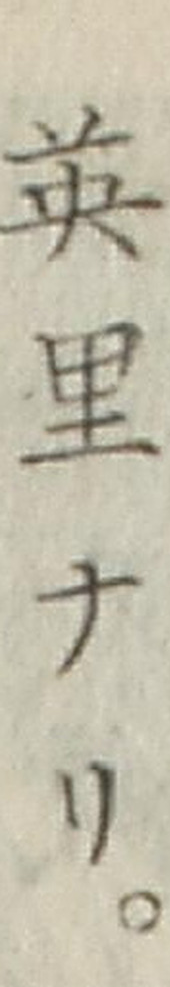英里ナリ。
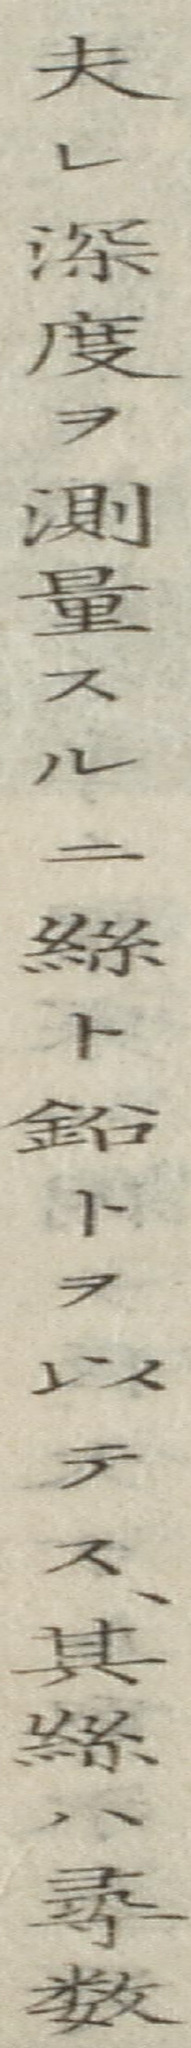夫レ深度ヲ測量スルニ糸ト鉛トヲ以テス、其糸ハ尋数
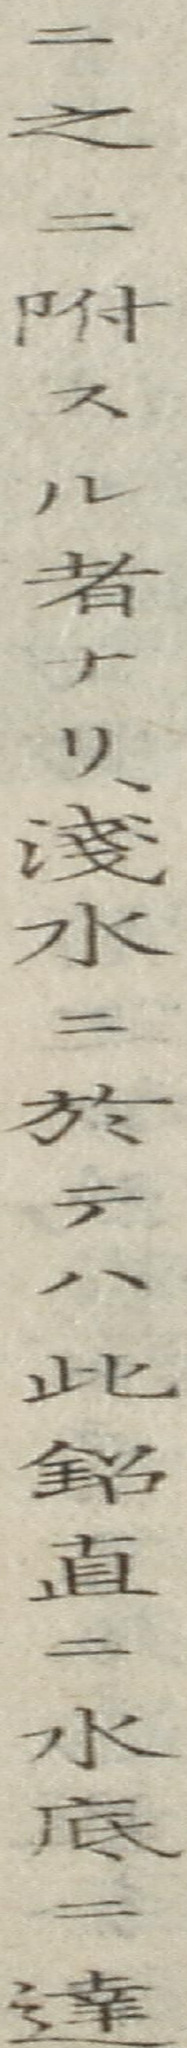ニ之ニ附スル者ナリ、浅水ニ於テハ此鉛直ニ水底ニ達
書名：地形論　巻二
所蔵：東京大学地震研究所図書室 Earthquake Research Institute Library, The University of Tokyo, JAPAN
